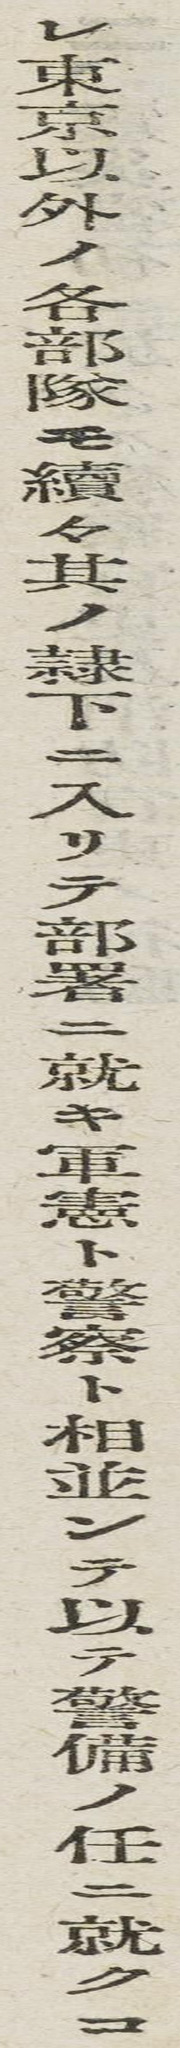レ東京以外ノ各部隊モ続々其ノ隷下ニ入リテ部署ニ就キ軍憲ト警察ト相並ンテ以テ警備ノ任ニ就クコ
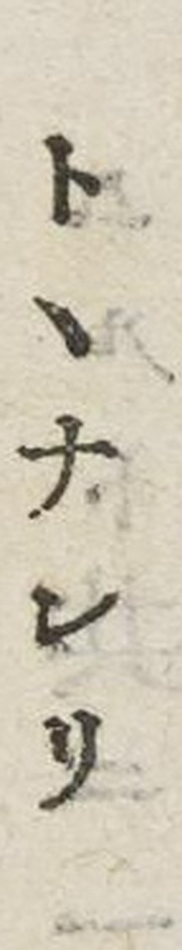トヽナレリ
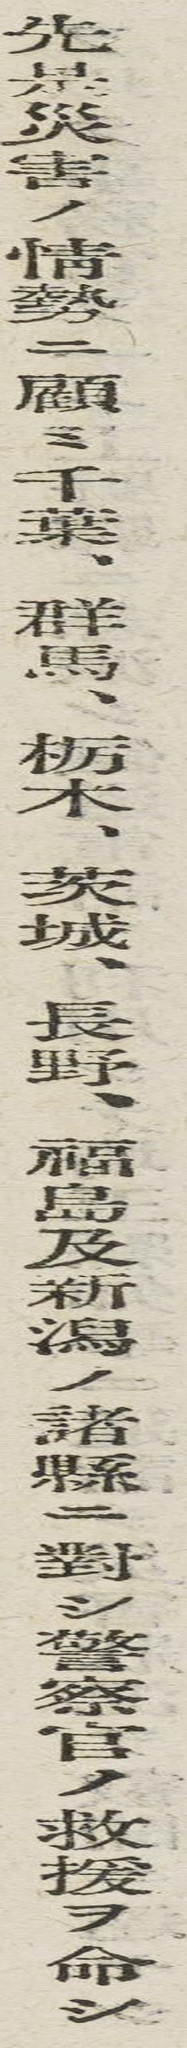先是災害ノ情勢ニ顧ミ千葉、群馬、栃木、茨城、長野、福島及新潟ノ諸県ニ対シ警察官ノ救援ヲ命シ
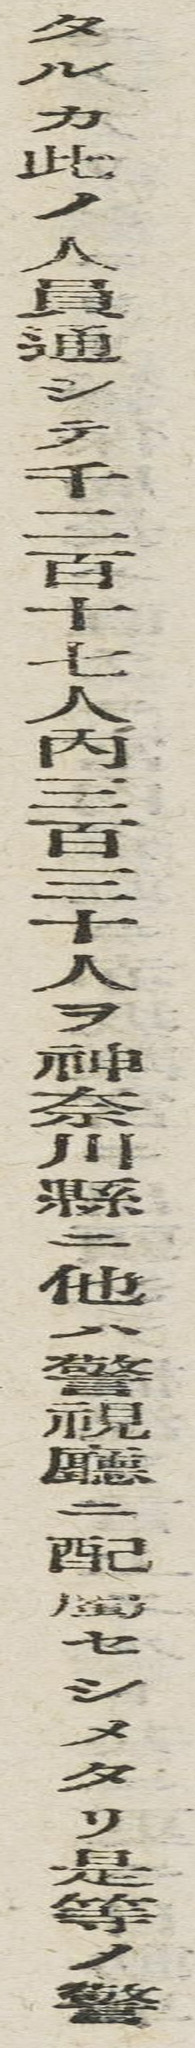タルカ此ノ人員通シテ千二百十七人内三百三十人ヲ神奈川県ニ他ハ警視庁ニ配属セシメタリ是等ノ警
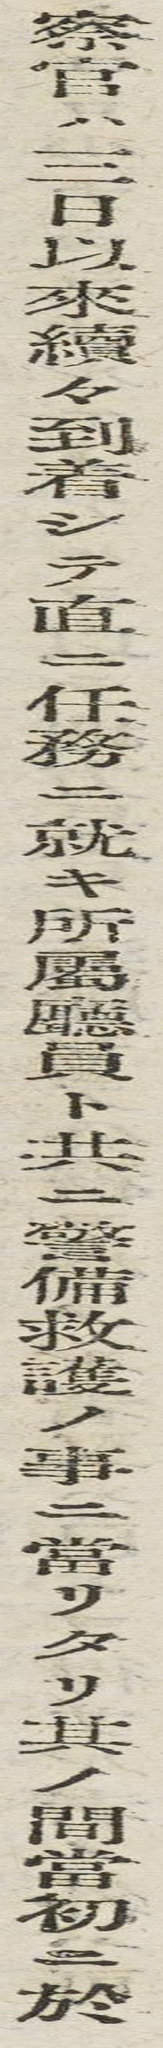察官ハ三日以来続々到着シテ直ニ任務ニ就キ所属庁員ト共ニ警備救護ノ事ニ当リタリ其ノ間当初ニ於
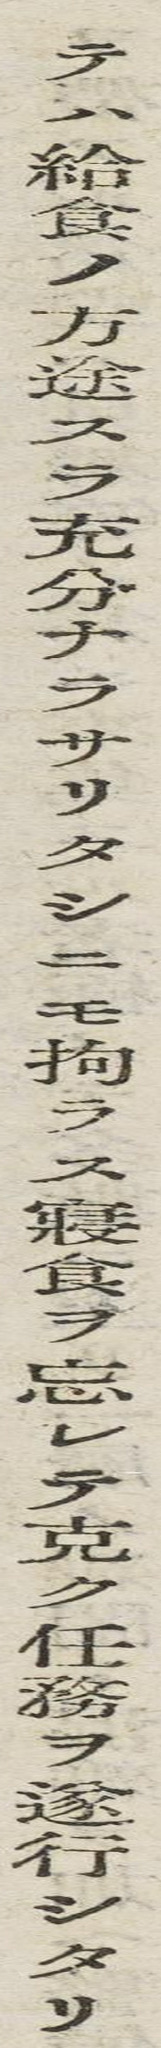テハ給食ノ方途スラ充分ナラサリタシニモ拘ラス寝食ヲ忘レテ克ク任務ヲ遂行シタリ
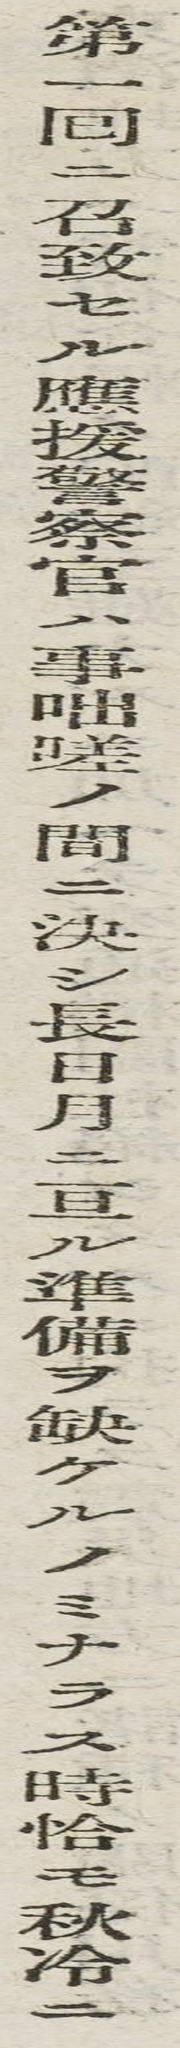第一回ニ召致セル応援警察官ハ事咄嗟ノ間ニ決シ長日月ニ亘ル準備ヲ缺ケルノミナラス時恰モ秋冷ニ
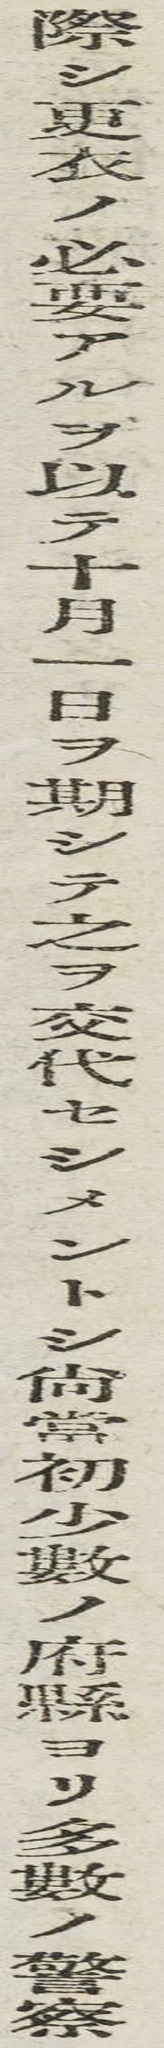際シ更衣ノ必要アルヲ以テ十月一日ヲ期シテ之ヲ交代セシメントシ尚当初少数ノ府県ヨリ多数ノ警察
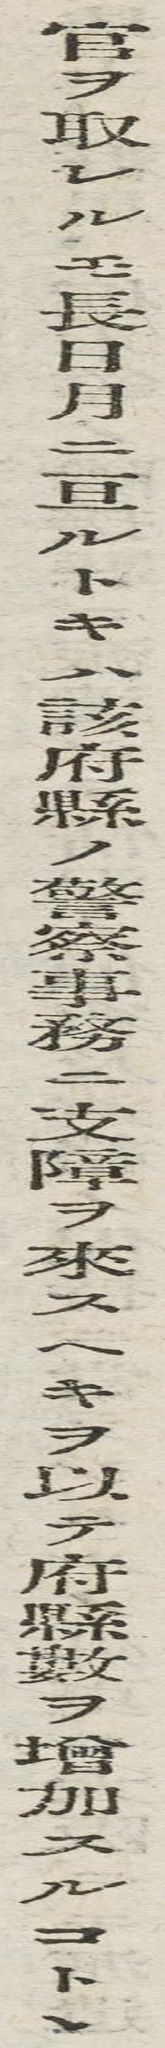官ヲ取レルモ長日月ニ亘ルトキハ該府県ノ警察事務ニ支障ヲ来スヘキヲ以テ府県数ヲ増加スルコトヽ
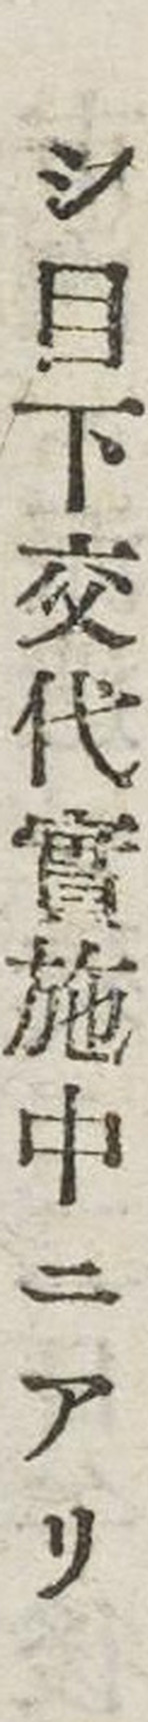シ目下交代実施中ニアリ
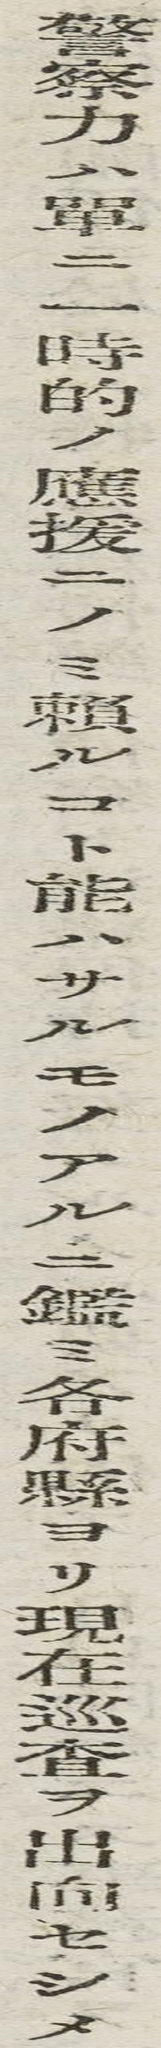警察力ハ単ニ一時的ノ応援ニノミ頼ルコト能ハサルモノアルニ鑑ミ各府県ヨリ現在巡査ヲ出向セシメ
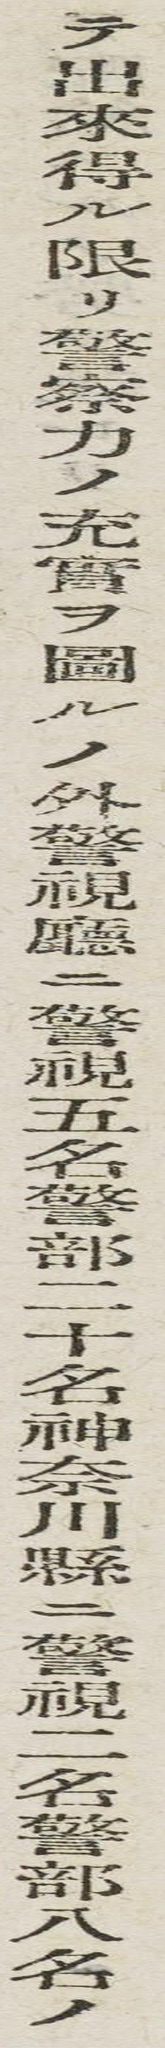テ出来得ル限リ警察力ノ充実ヲ図ルノ外警視庁ニ警視五名警部二十名神奈川県ニ警視二名警部八名ノ
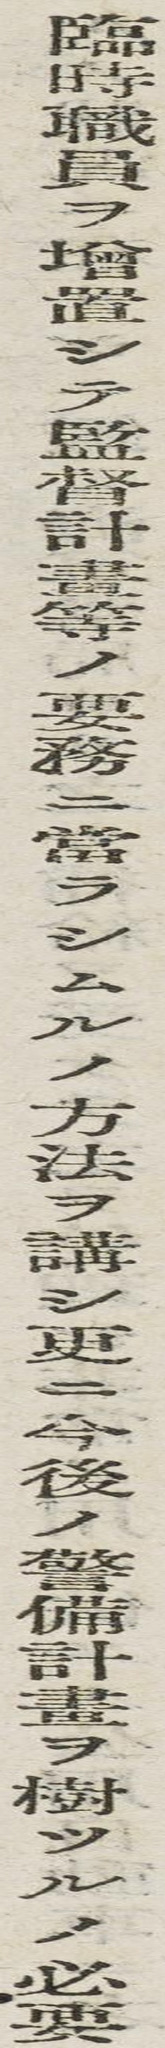臨時職員ヲ増値シテ監督計画等ノ要務ニ当ラシムルノ方法ヲ講シ更ニ今後ノ警備計画ヲ樹ツルノ必要
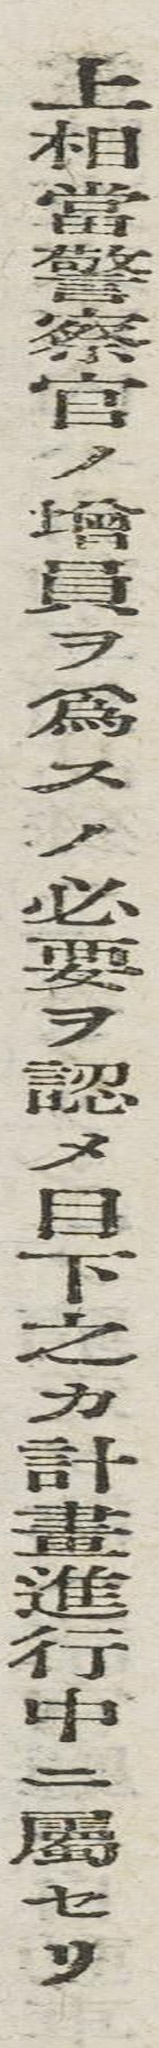上相当警察官ノ増員ヲ為ス必要ヲ認メ目下之カ計画進行中ニ属セリ
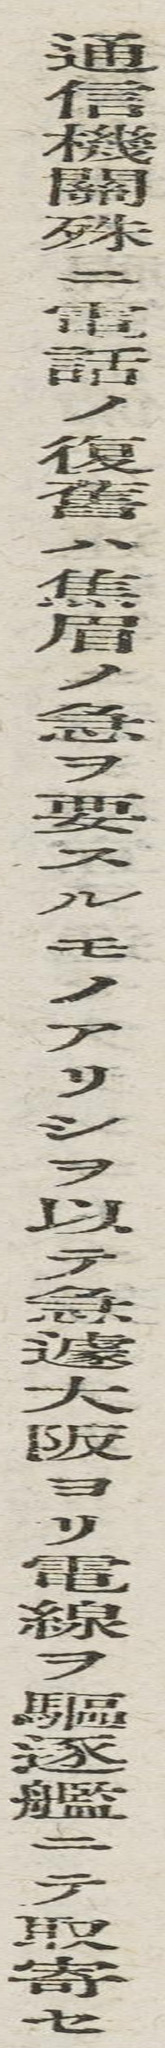通信機関殊ニ電話ノ復旧ハ焦眉ノ急ヲ要スルモノアリシヲ以テ急遽大阪ヨリ電線ヲ駆逐艦ニテ取寄セ
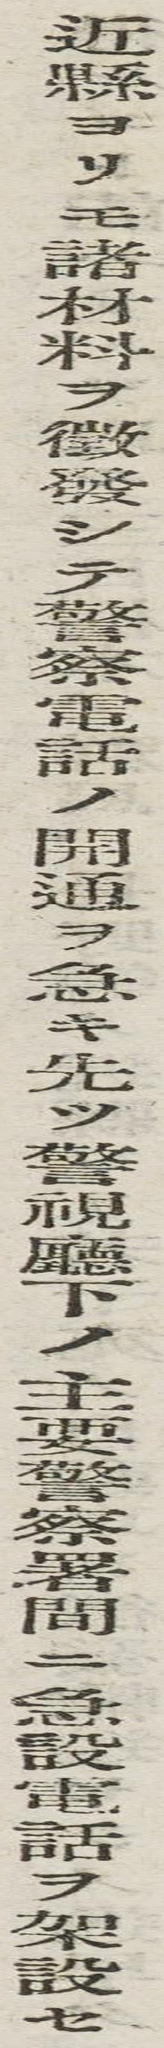近県ヨリモ諸材料ヲ徴発シテ警察電話ノ開通ヲ急キ先ツ警視庁下ノ主要警察署間ニ急設電話ヲ架設セ
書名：震災被害状況並救護施設概要
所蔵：東京大学地震研究所図書室 Earthquake Research Institute Library, The University of Tokyo, JAPAN
